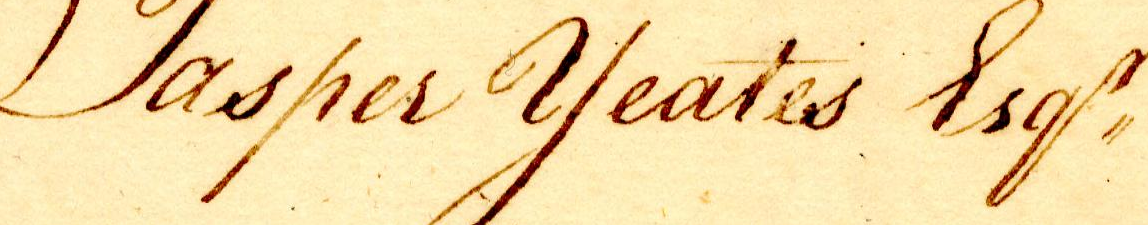Jasper Yeates Esq^r
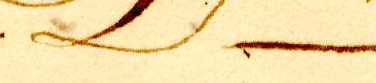D^r
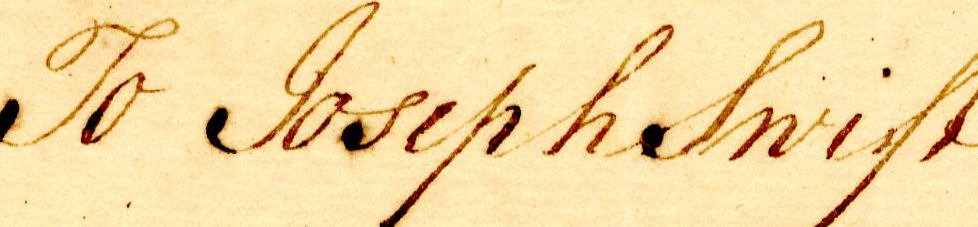To Joseph Swift
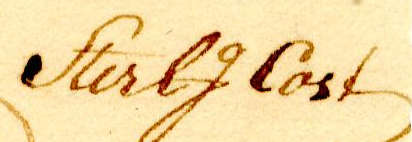Sterl^g Cost
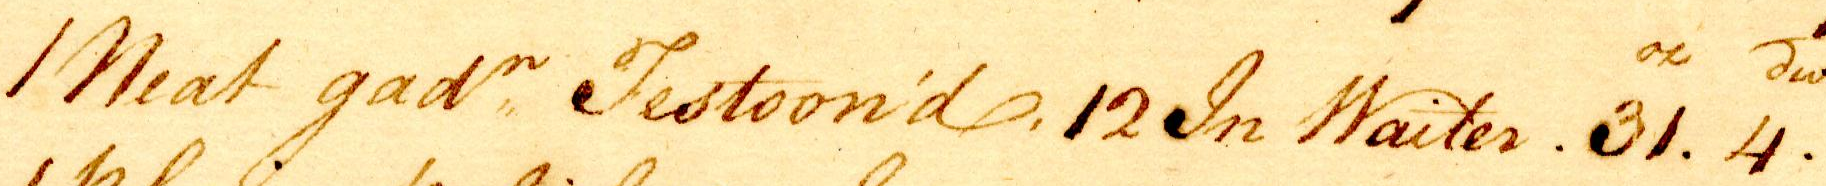1 Neat gad^n. Festoon'd 12 In Waiter. 31. 4.
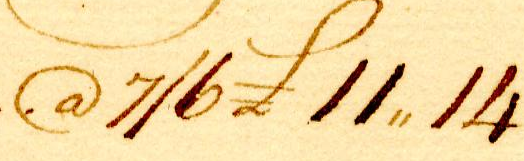@ 7s6 £11. 14
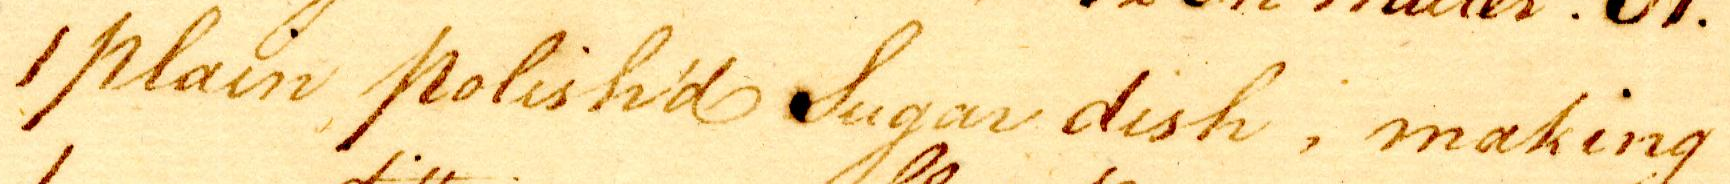1 plain Polish'd Sugar dish, making
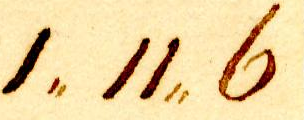1. 11.6
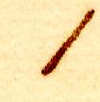1
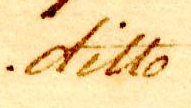ditto
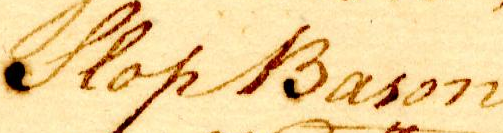Slop Bason
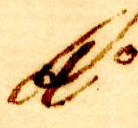A
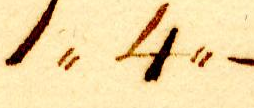1.4.
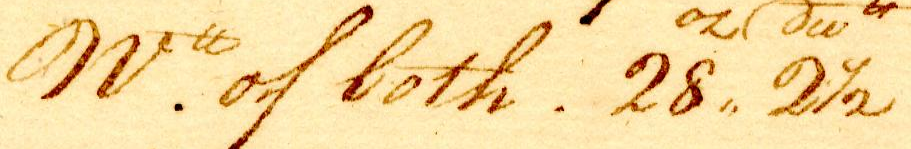N^r. of both. 28. 2 1/2
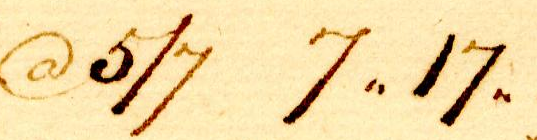@ 5s7 7. 17.
